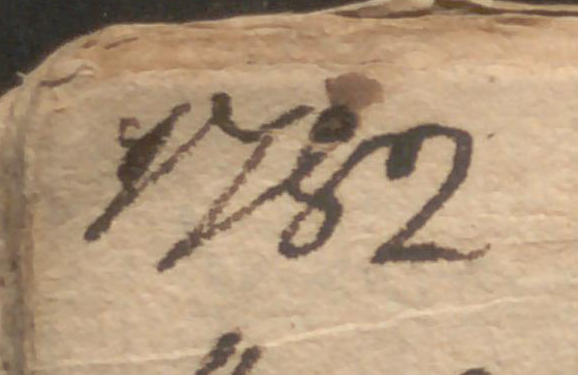1782
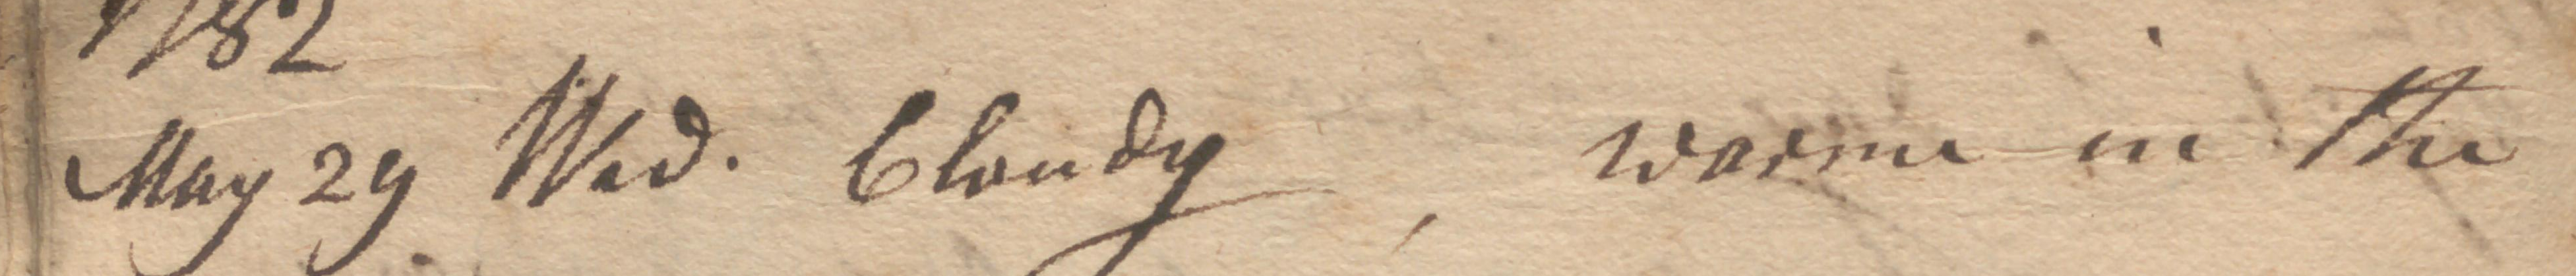May 29 Wed. Cloudy warme in the
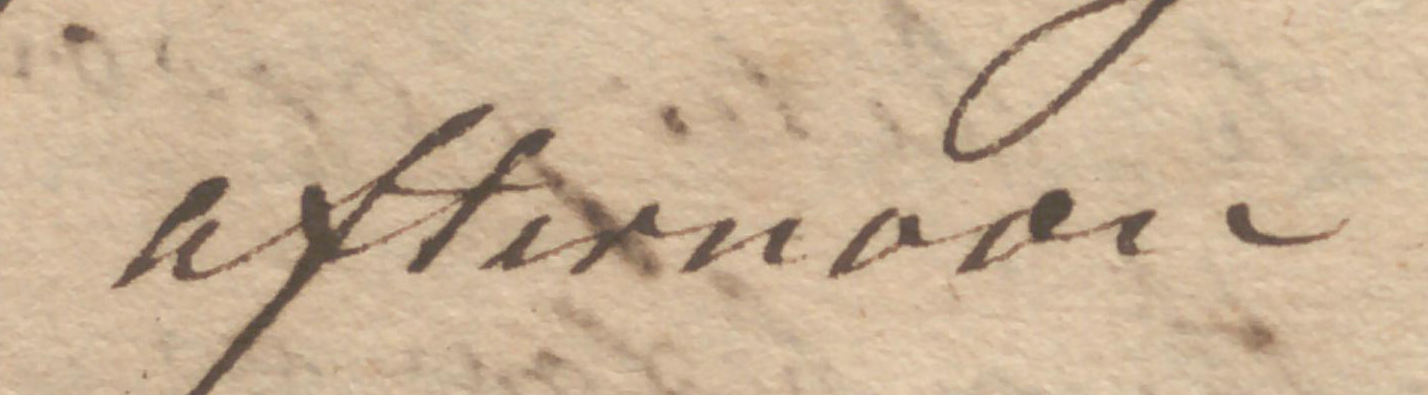afternoon
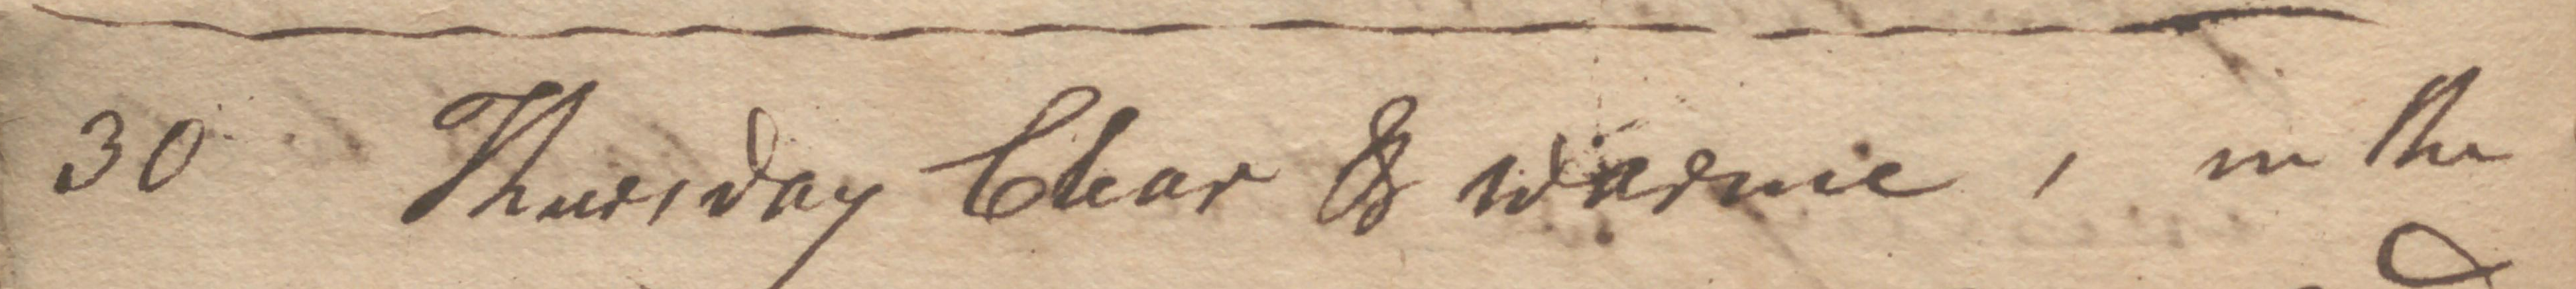30 Thursday Clear & warme, in the
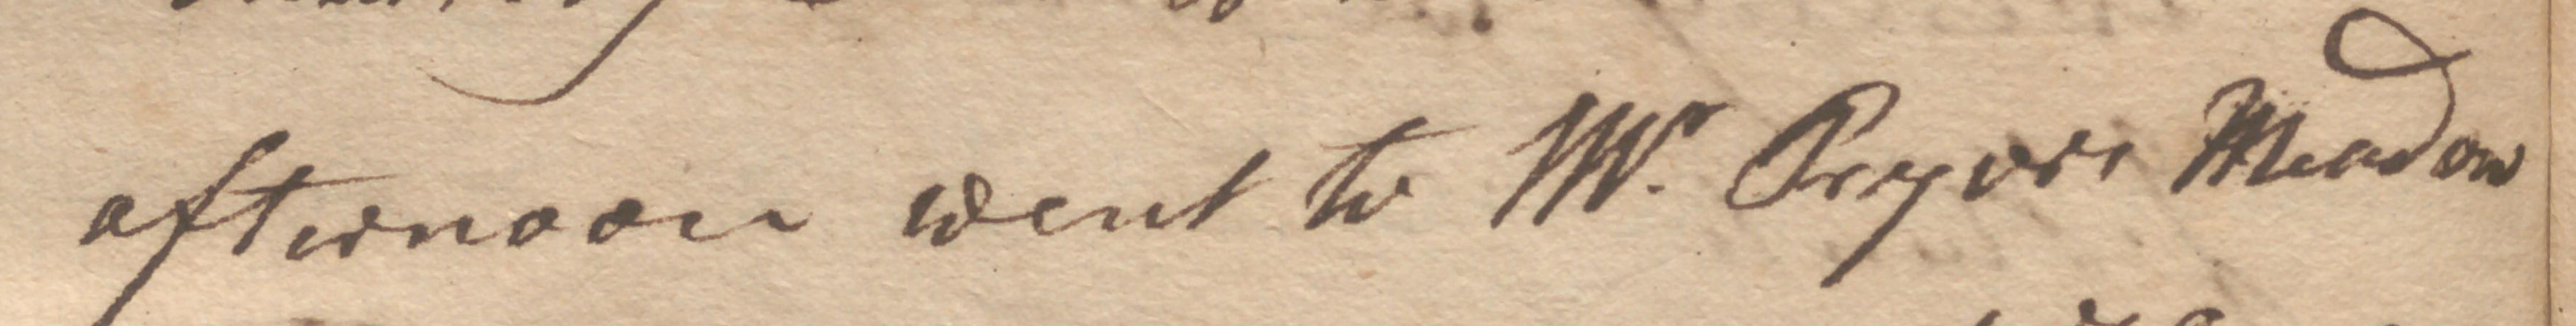afternoon went to M^r. Pryors Meadow
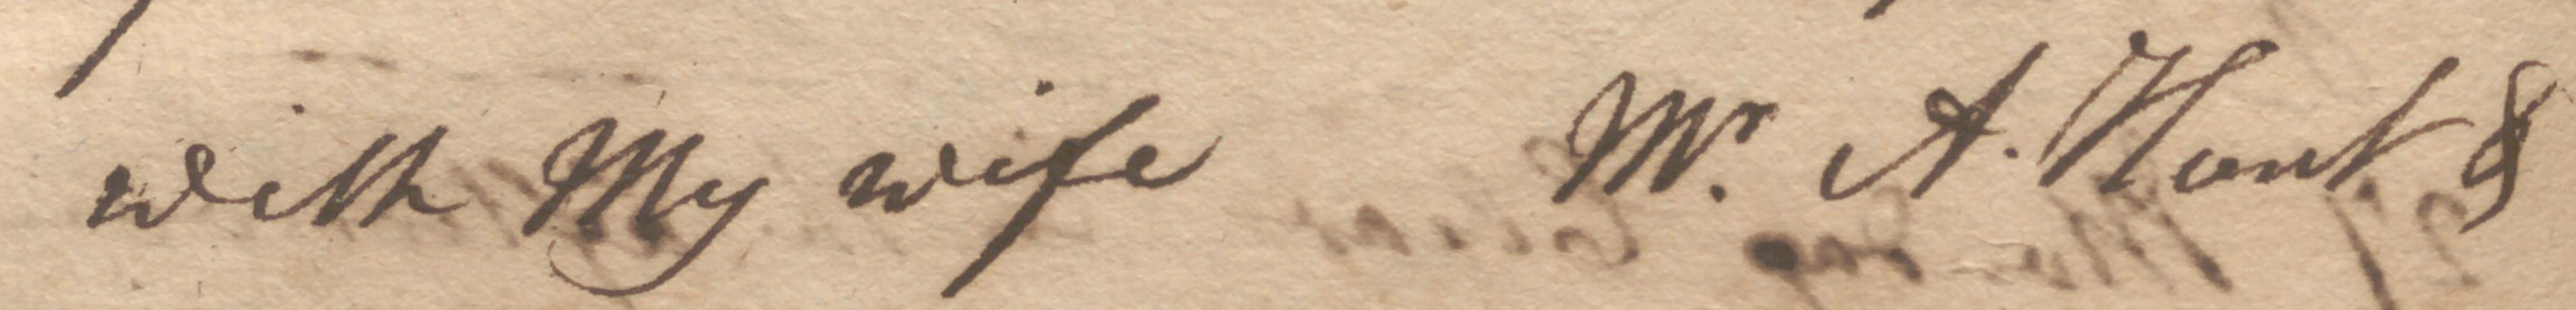with My wife M^r. A Hunt &
